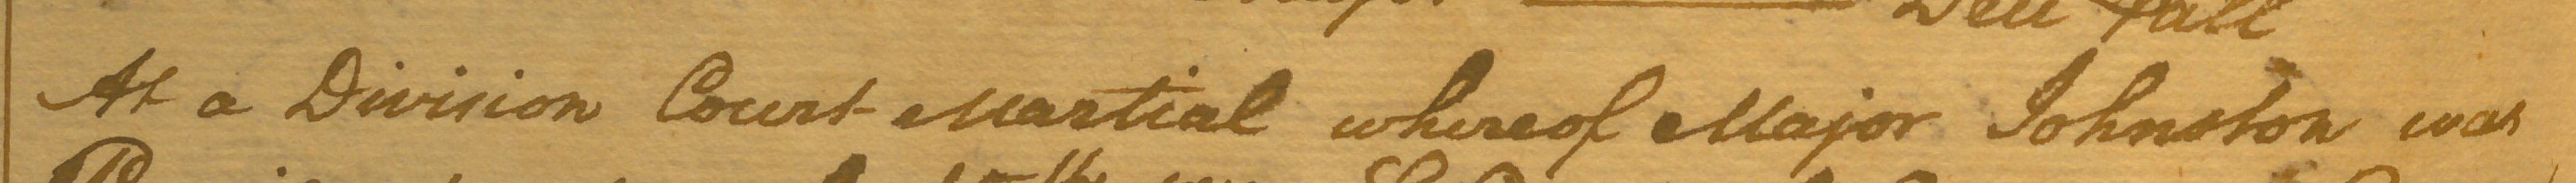At a Division Court Martial whereof Major Johnston was
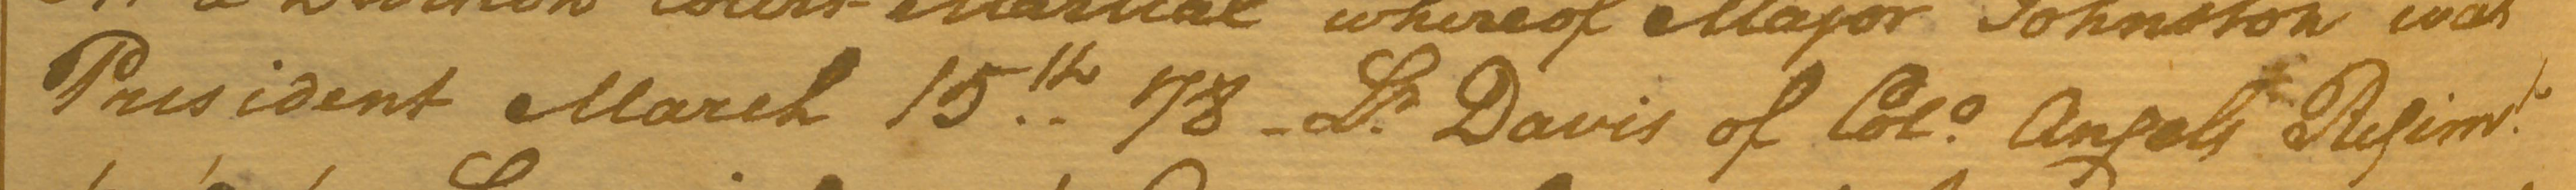President March 15^th. 78. L^t. Davis of Col^o. Angels Regim^t.
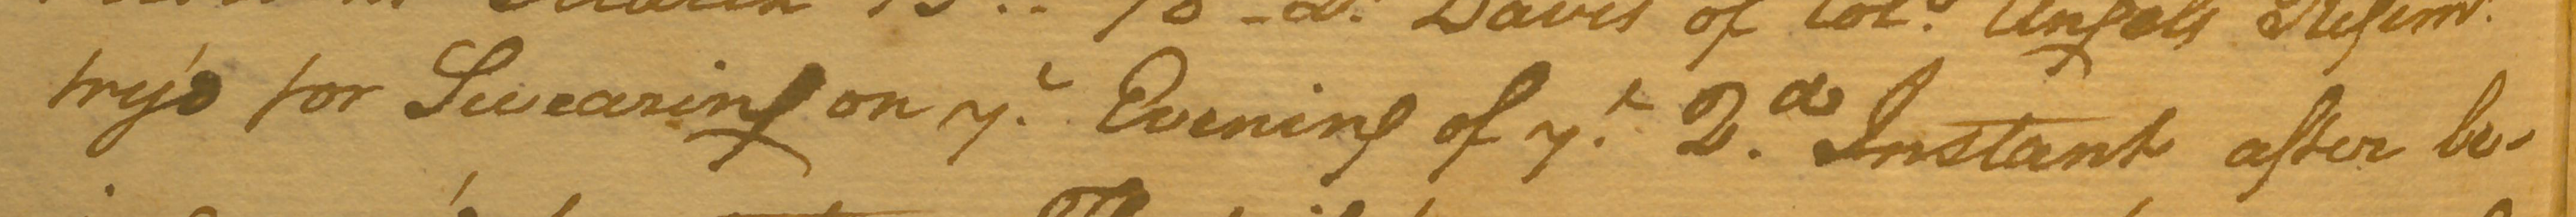try'd for Swearing on y^e. Evening of y^e. 2^d. Instant, after be-
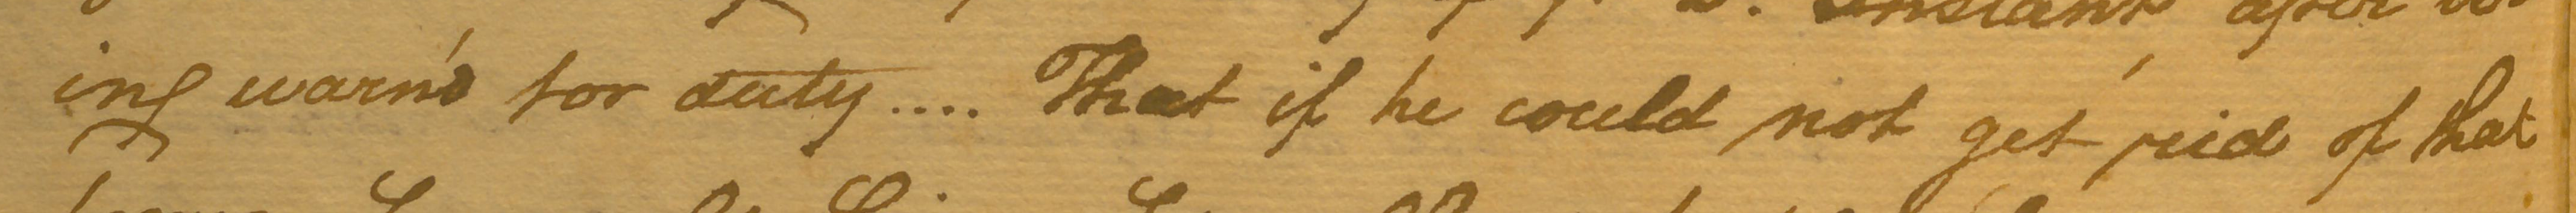ing warn'd for duty.... That if he could not get rid of that
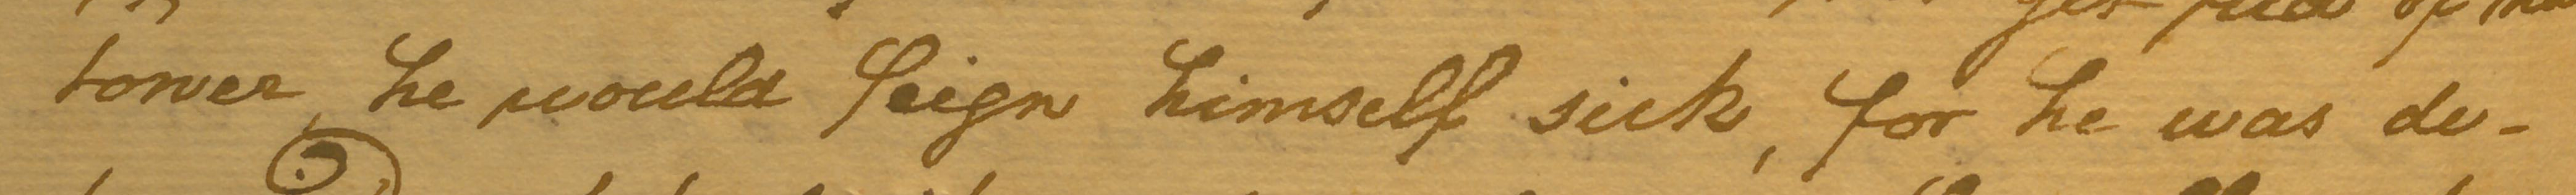tower, he would feign himself sick, for he was de-
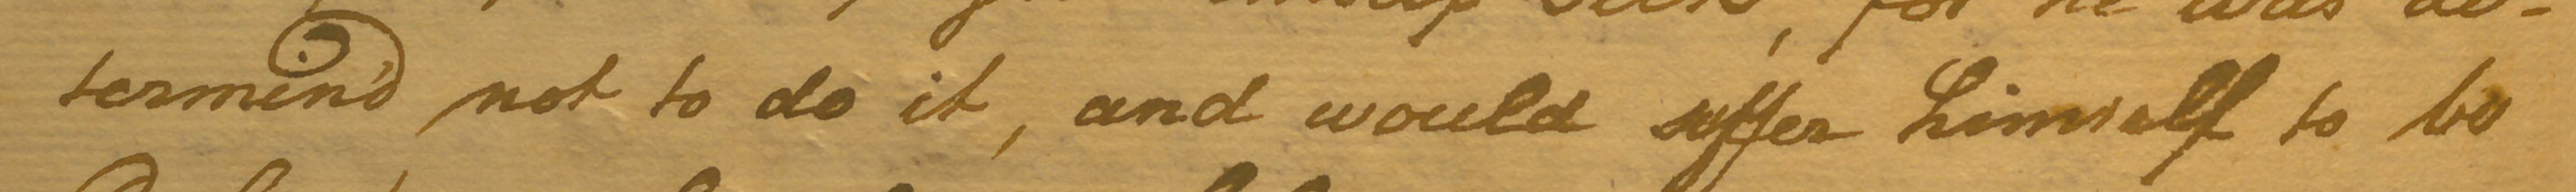termin'd not to do it, and would suffer himself to be
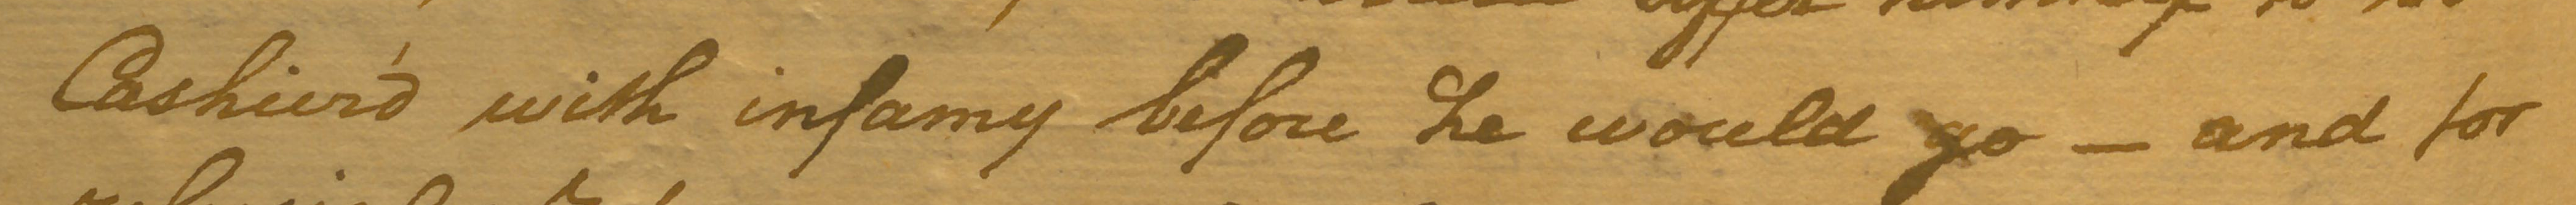Cashier'd with infamy before he would go- and for
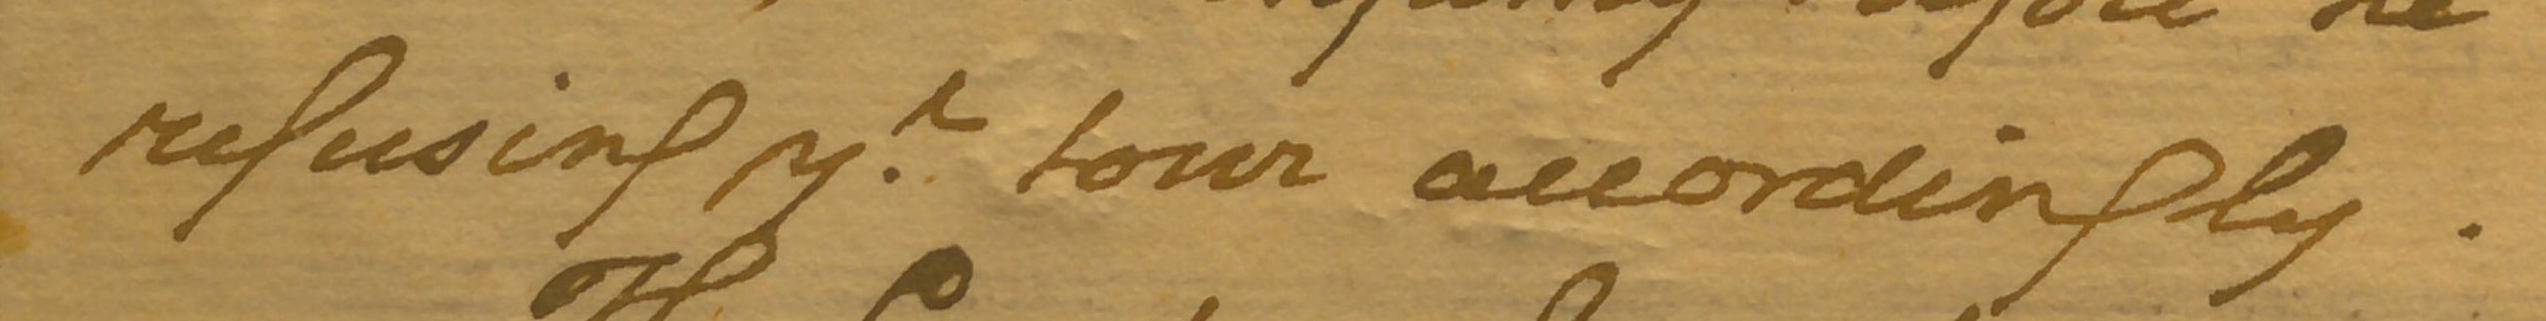refusing y^e. tour accordingly.
